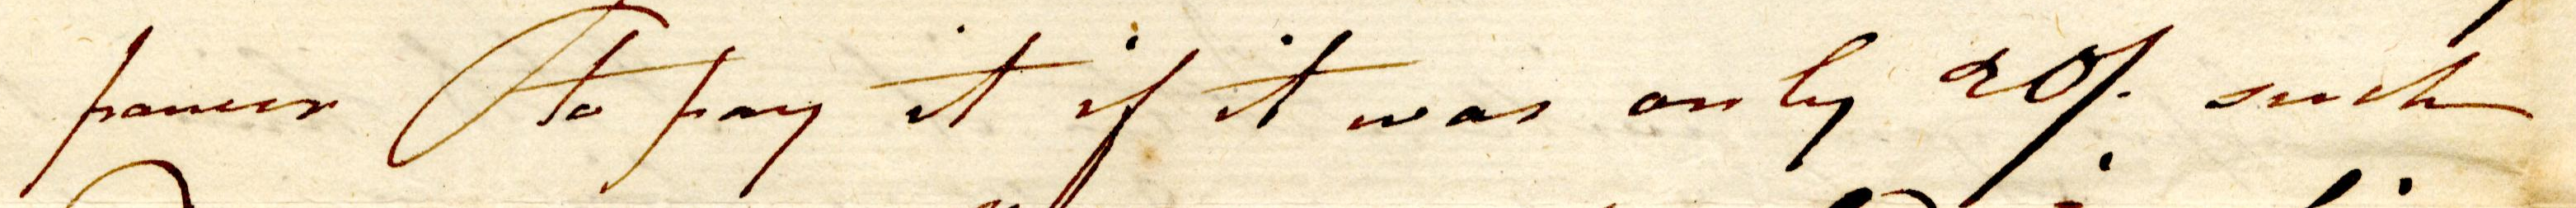power to pay it if it was only 20s. such
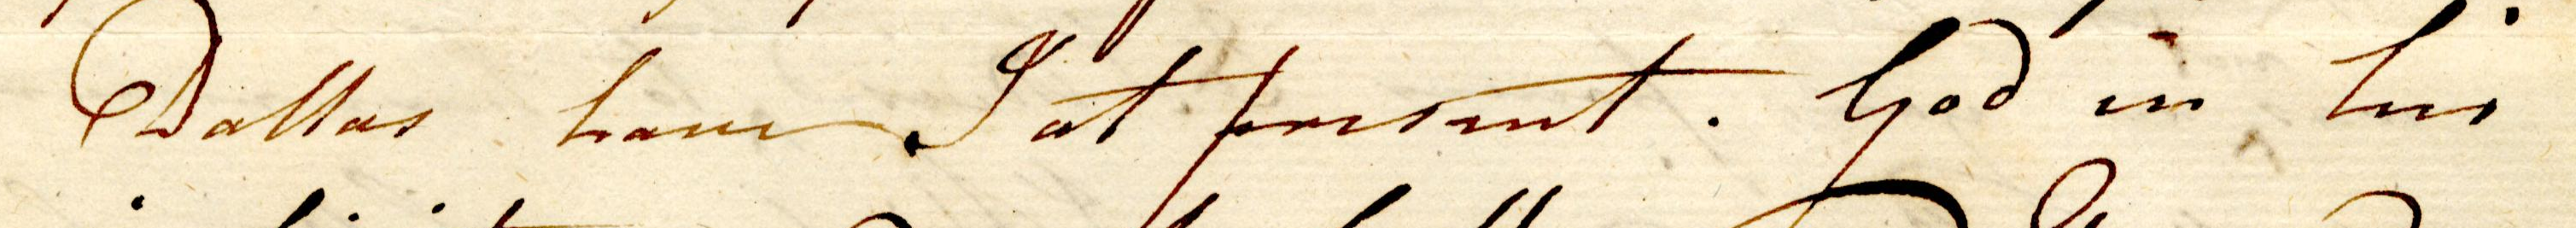Dollars have I at present. God in his
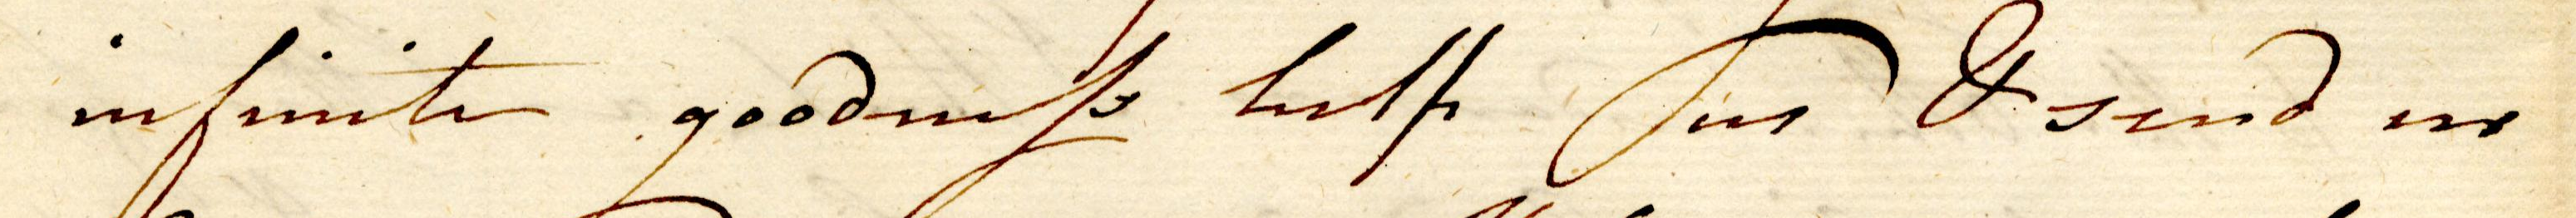infinite goodness help us & send me
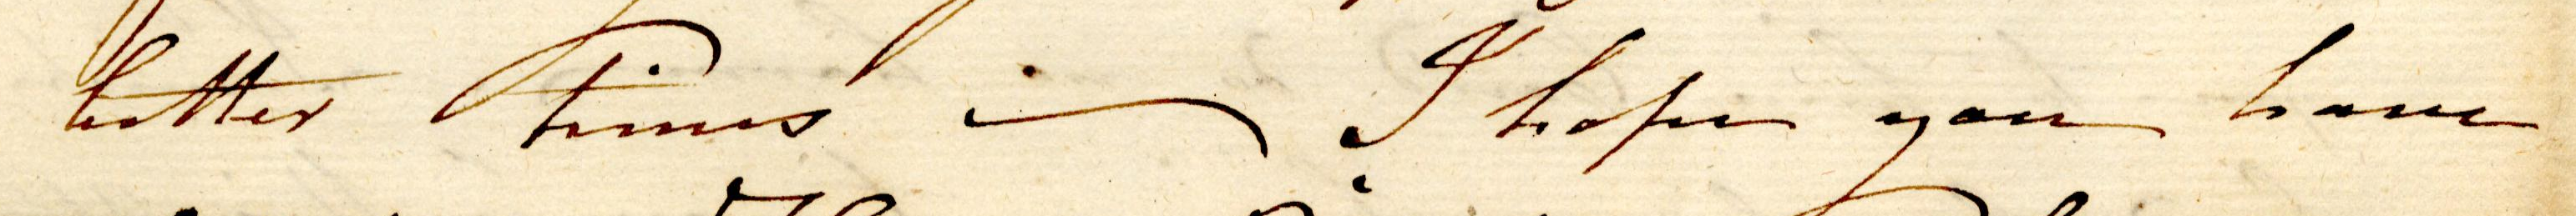better times- I hope you have
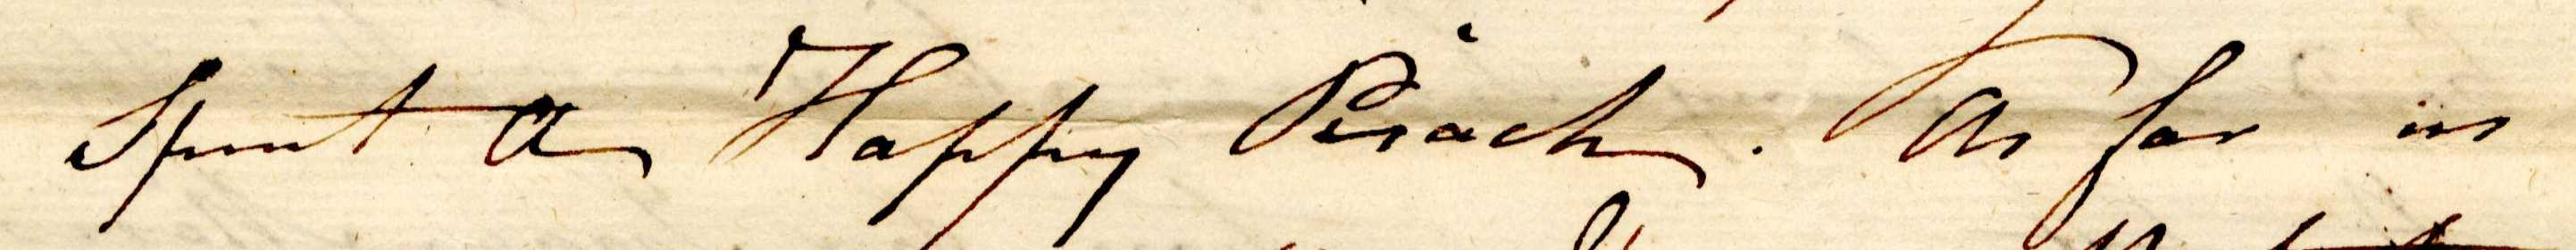spent a Happy Pesach: As far as
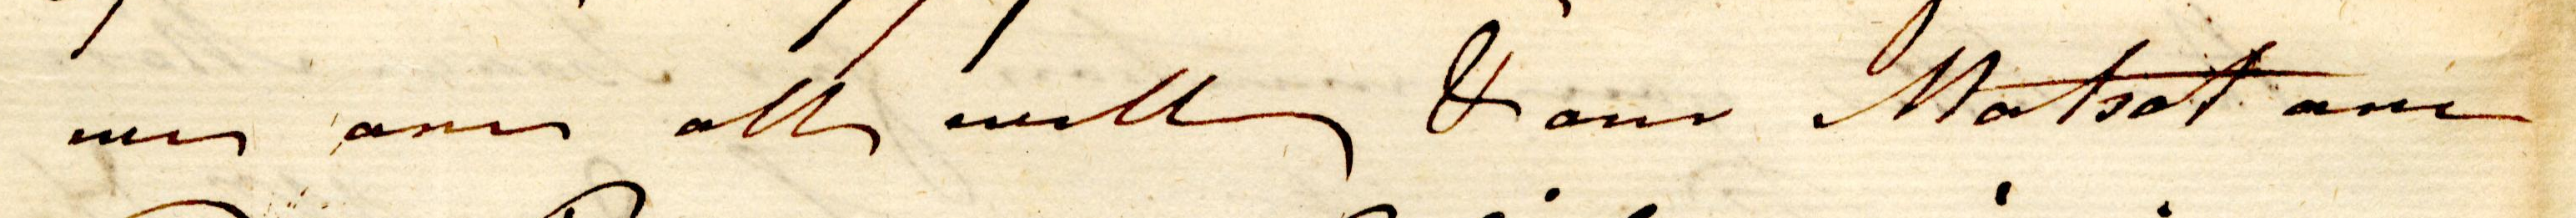me are all well & our Matsot and
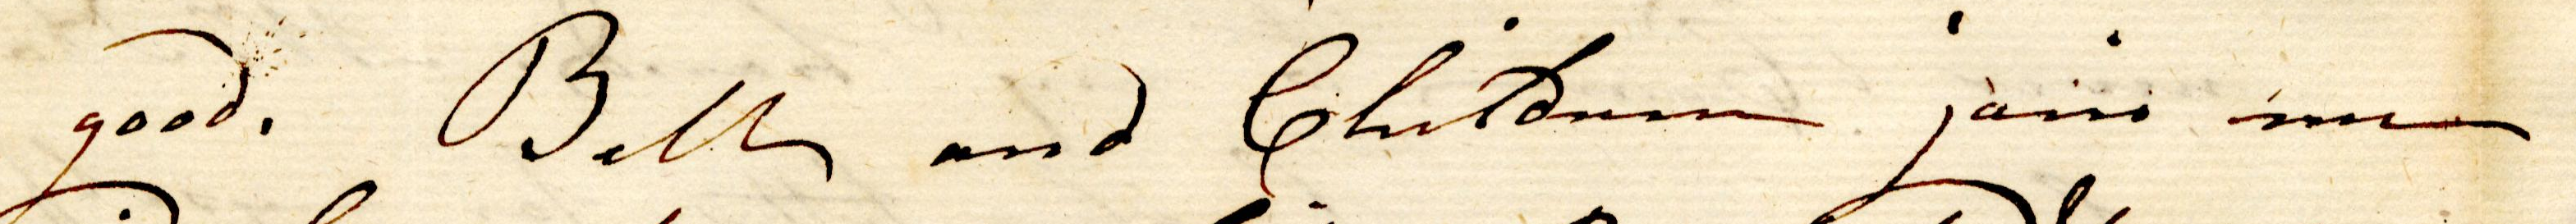good. Bell and Children join me
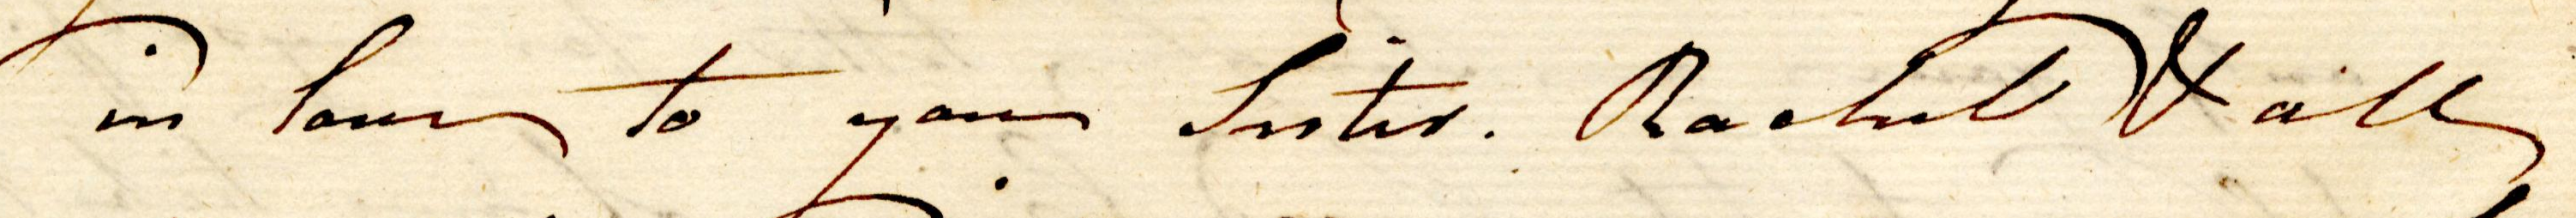in love to your sister. Rachel & all
